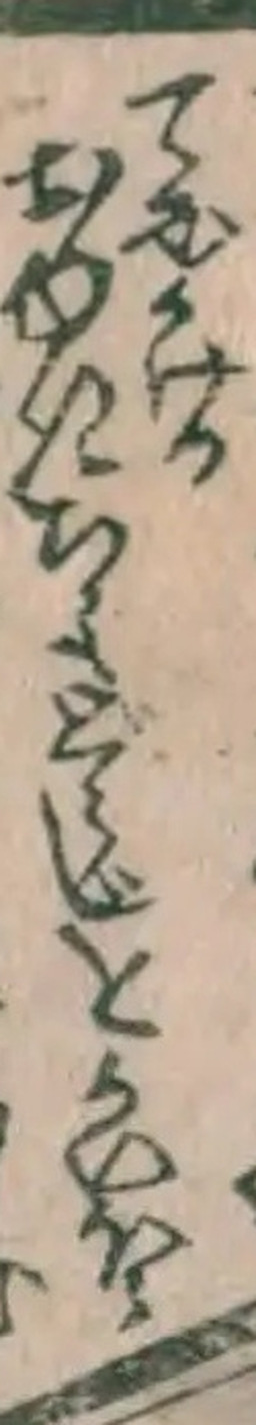おゆきちよどうじをかいほう
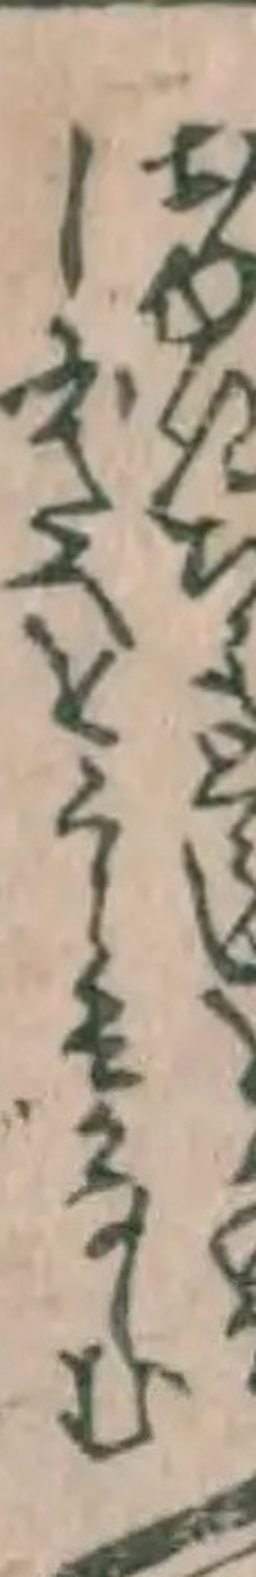し国たへをうらみかなしむ
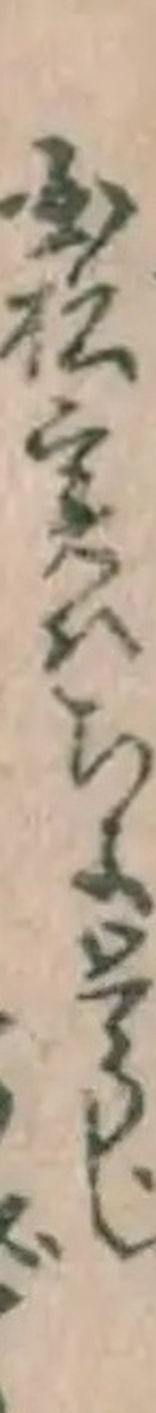国松実はちよどうじ
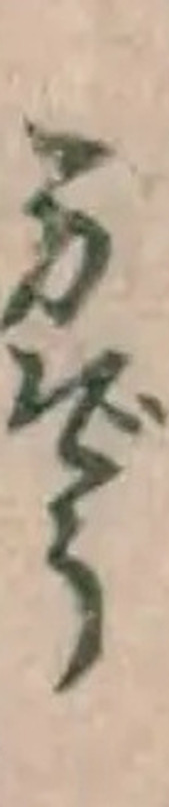万ぞう

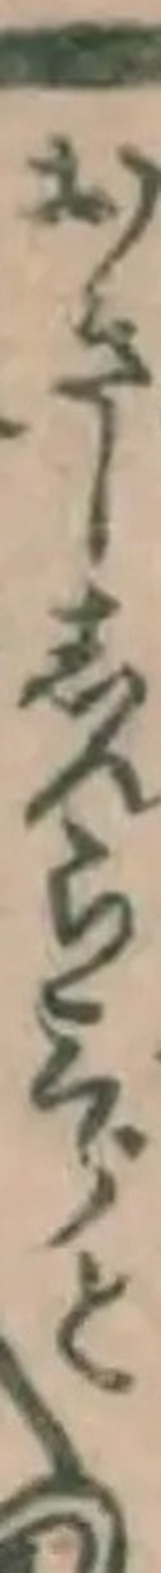おきししんら三郎と
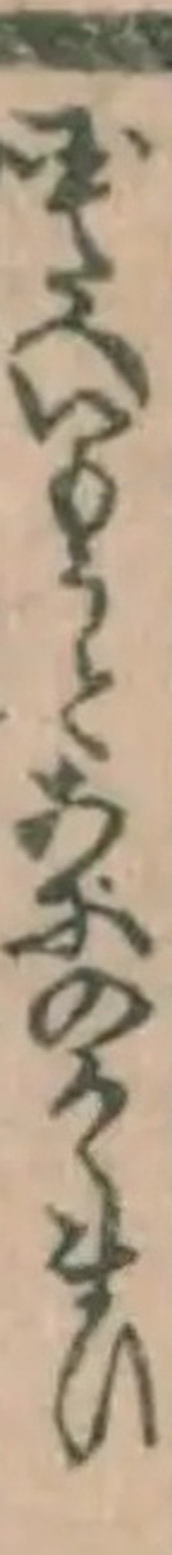国たへいもうとあにのかくまひ
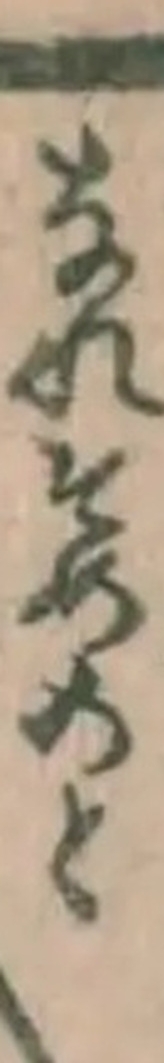なれそめあと
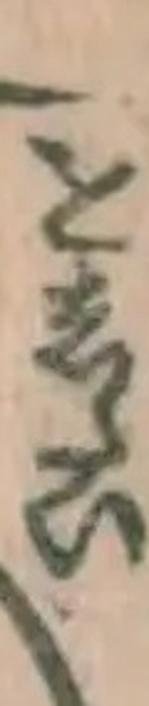をしたい
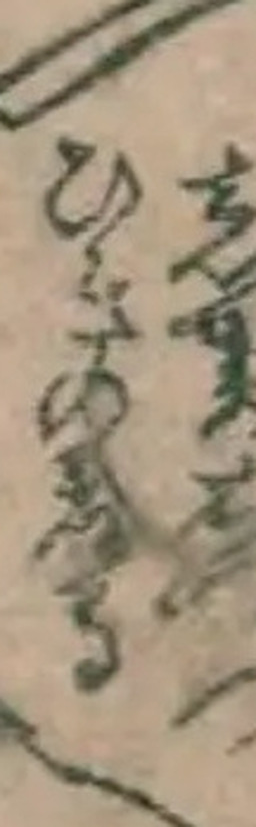ひきの藤馬
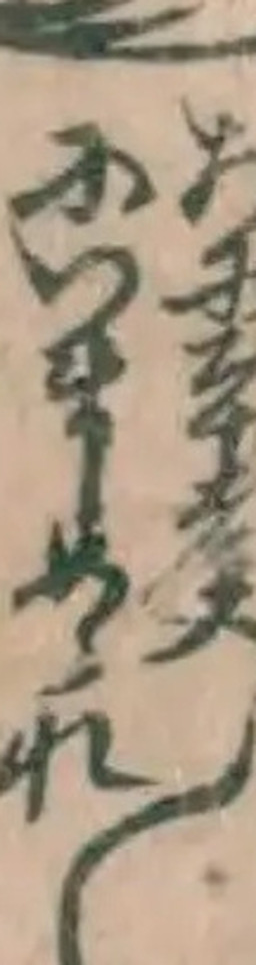にいましめられ
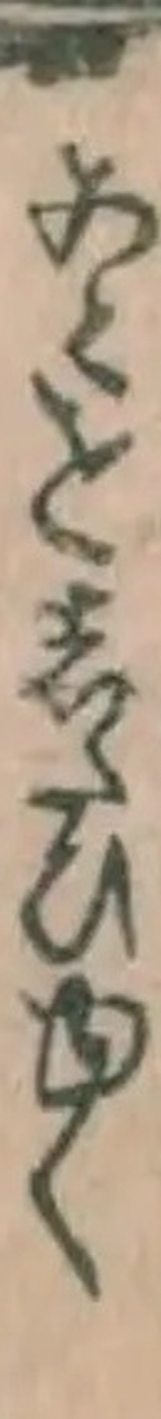あとをしたひゆく
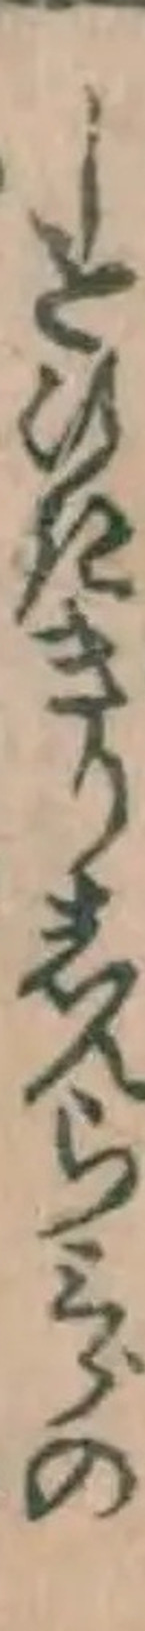しをひききりしんら三郎の
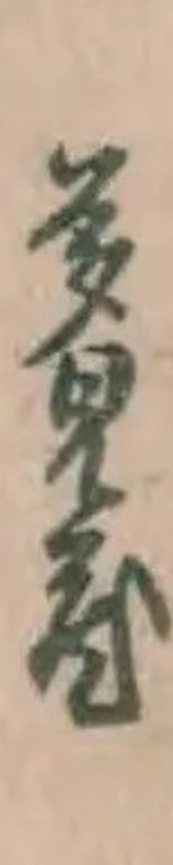多見蔵
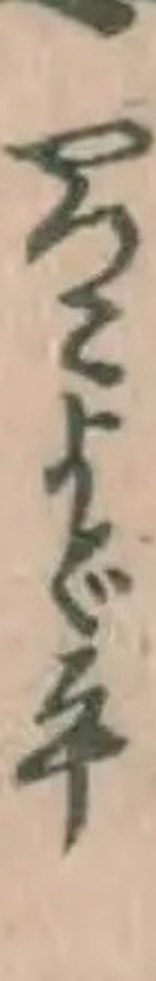やつこよど平
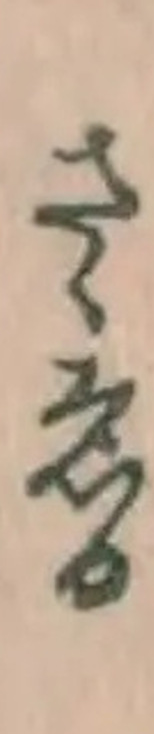さゝゑる
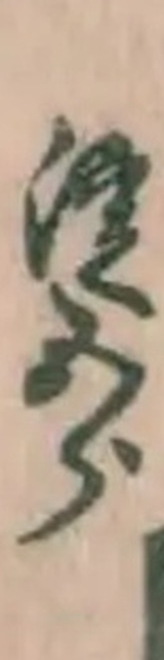淀五郎
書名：伊達錦對将 : 森田座
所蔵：国立国会図書館 National Diet Library, JAPAN
